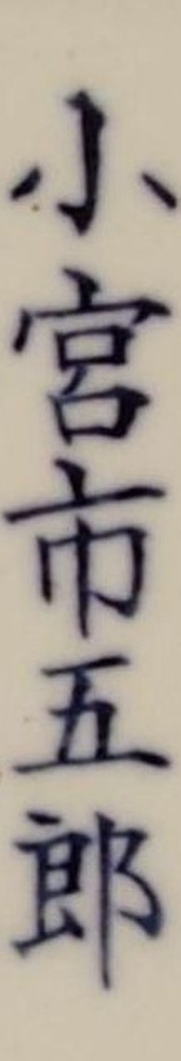小宮市五郎
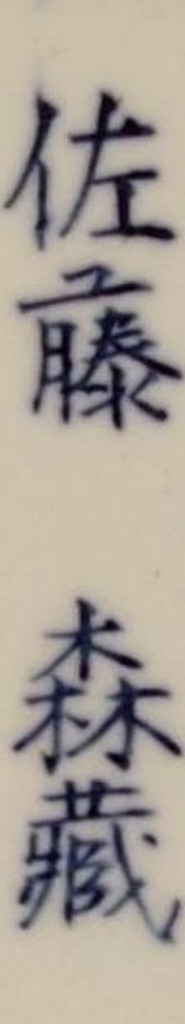佐藤森藏
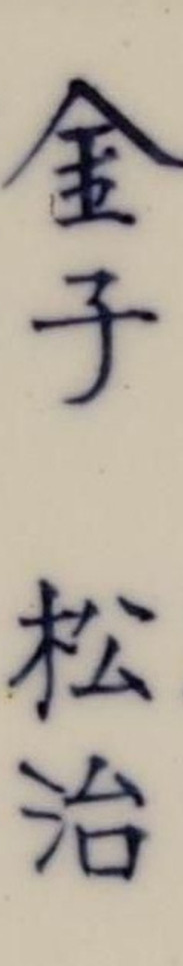金子松治
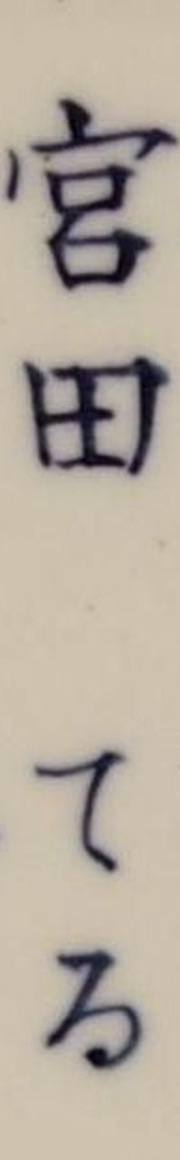宮田てる
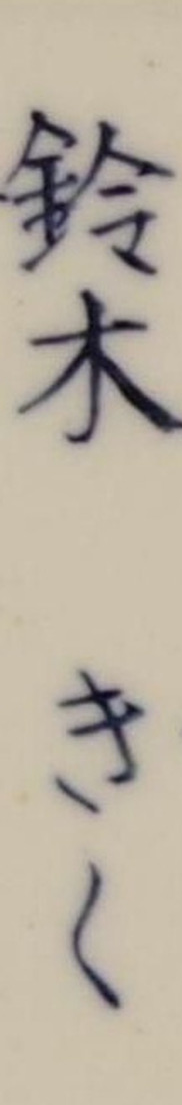鈴木きく
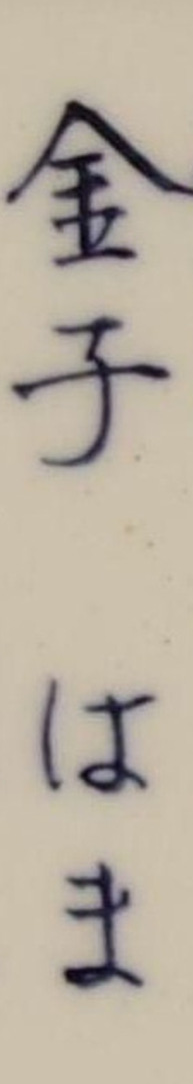金子はま
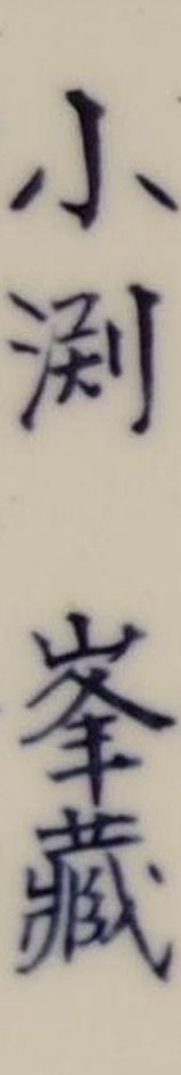小渕峯蔵
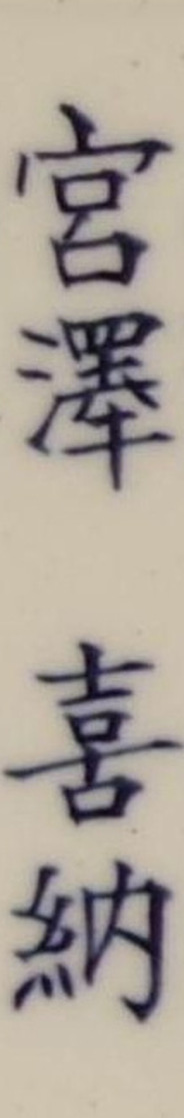宮澤喜納
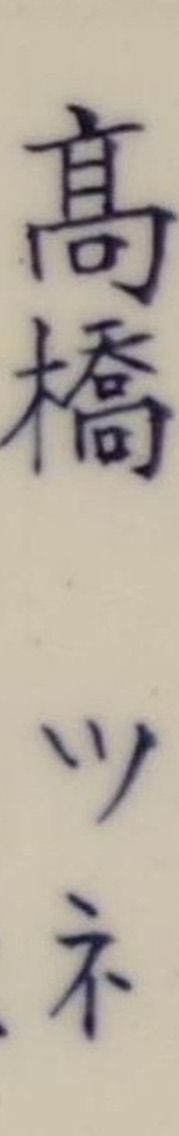高橋ツネ
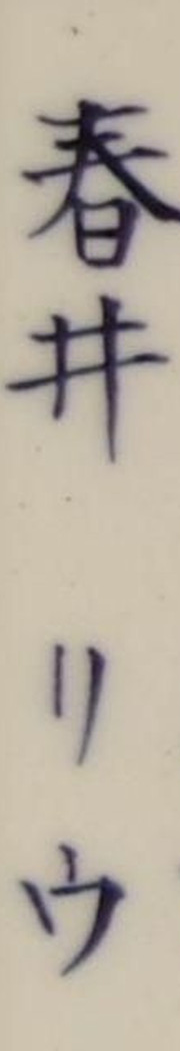春井リウ

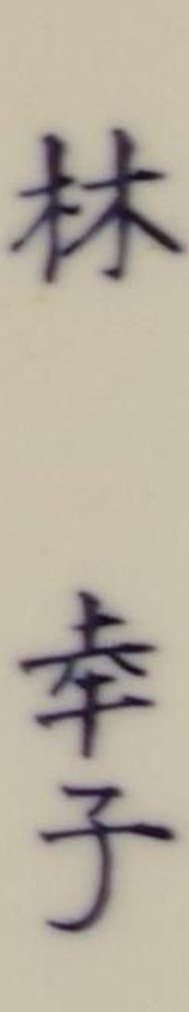林幸子
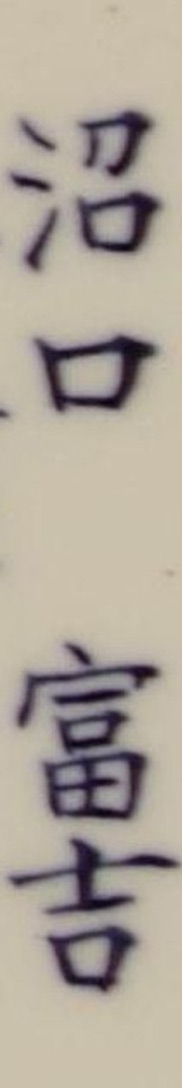沼口富吉
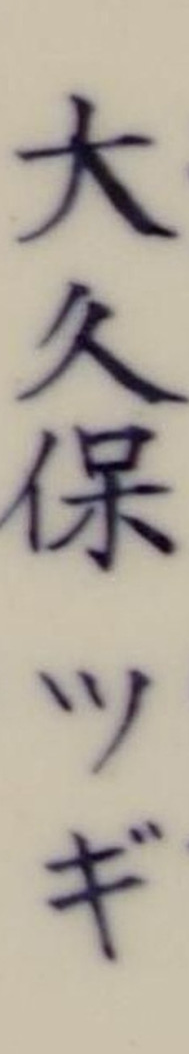大久保ツギ
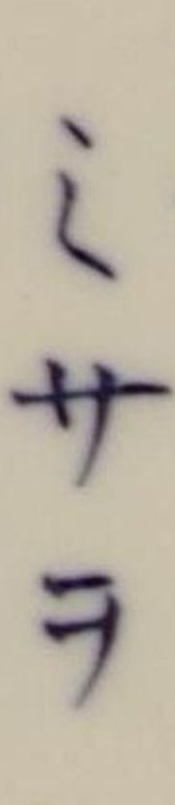ミサヲ
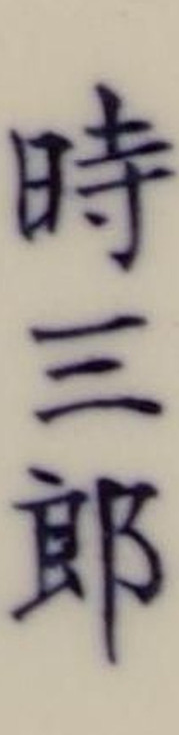時三郎
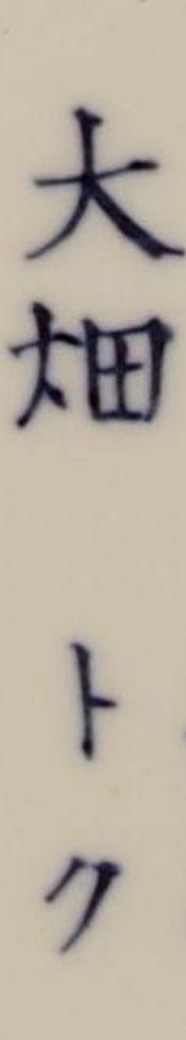大畑トク
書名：E~L
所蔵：高野山金剛峯寺
